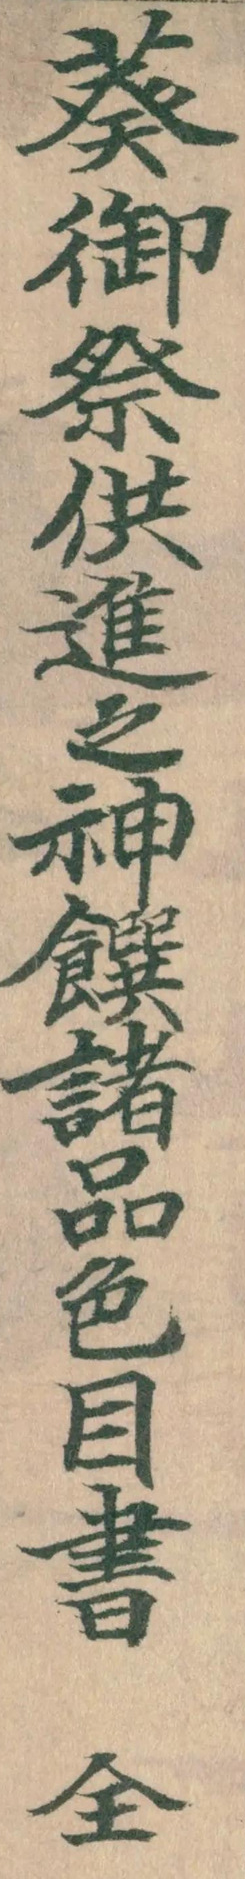葵御祭供進之神饌諸品色目書全

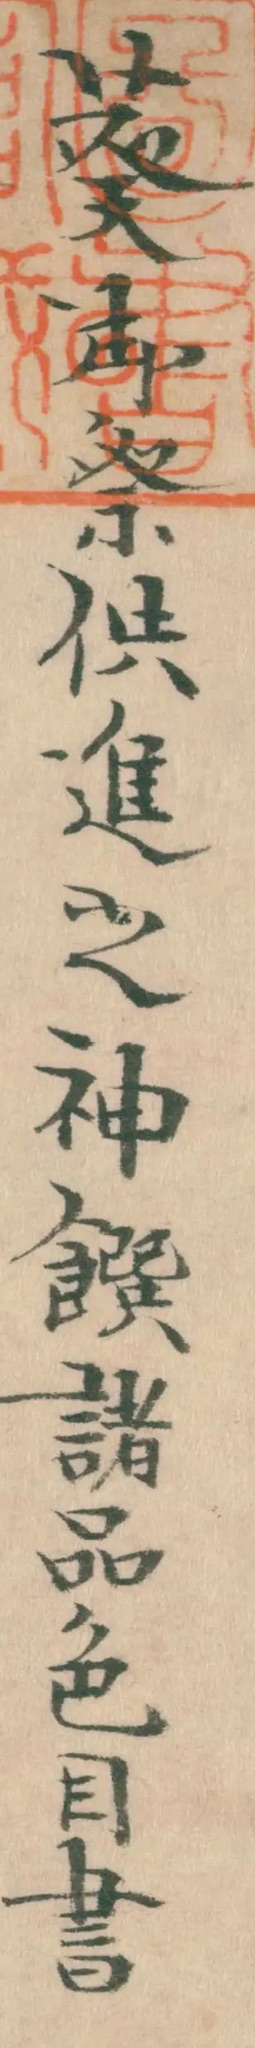葵御祭供進之神饌諸品色目書
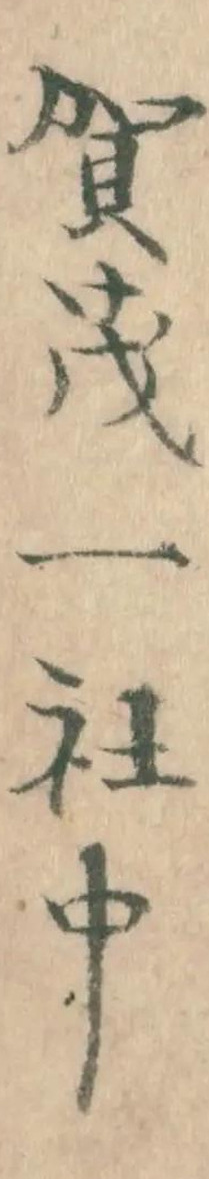賀茂一社中

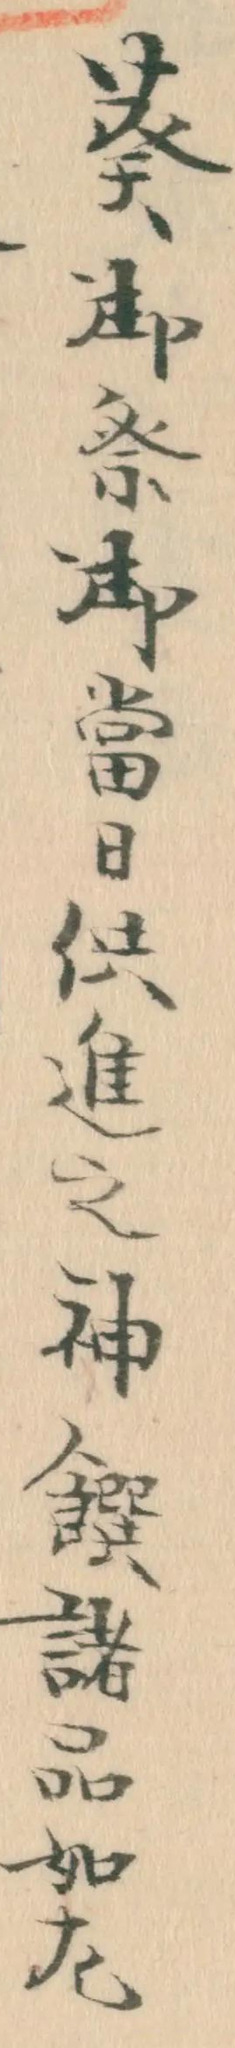葵御祭御当日供進之神饌諸品如左
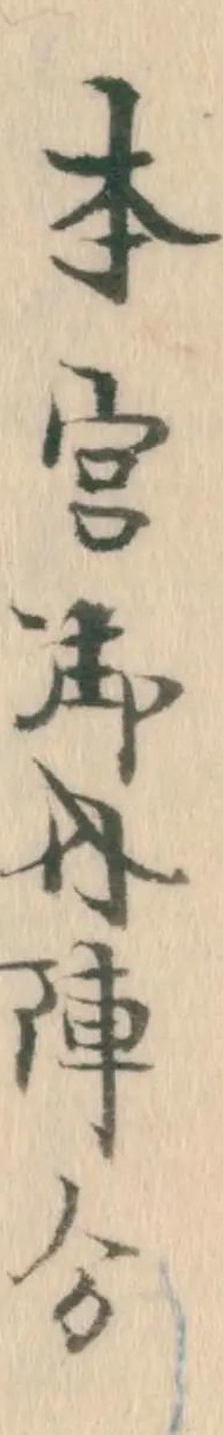本宮御内陣分
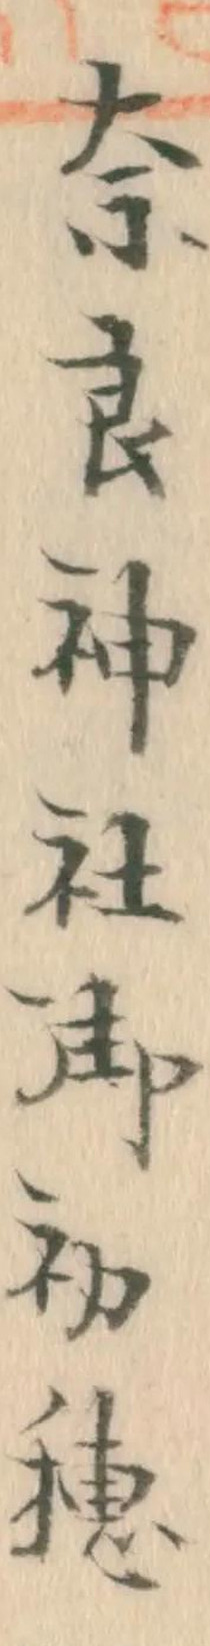一奈良神社御初穂
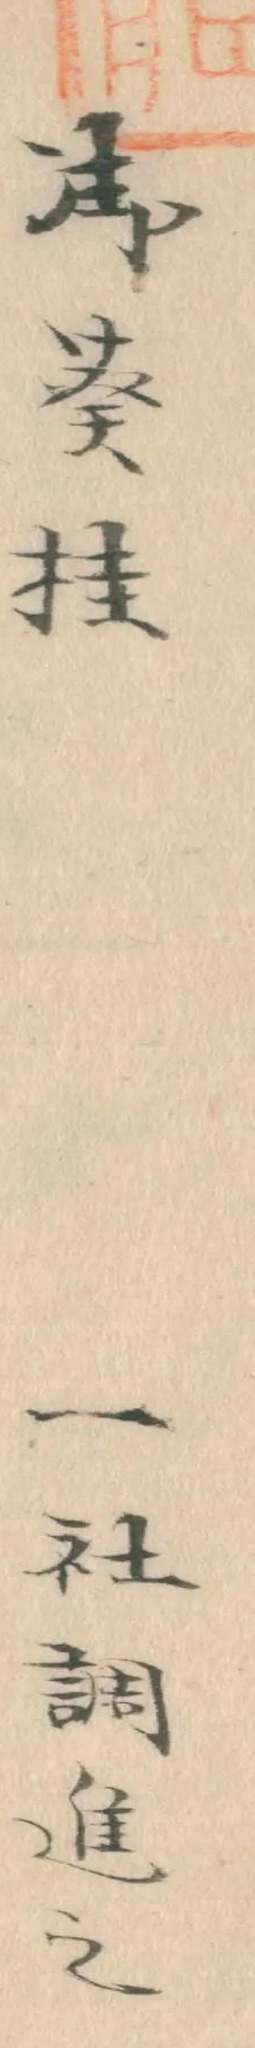一御葵桂一社調進之
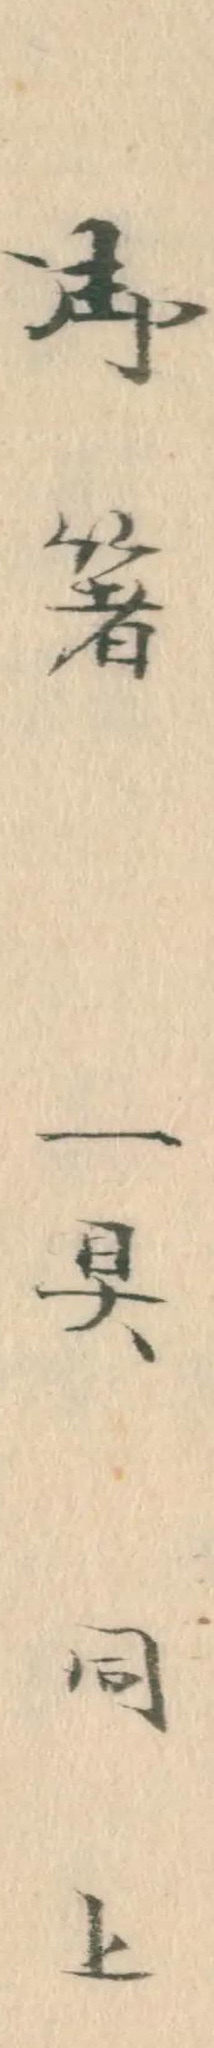一御箸一具同上
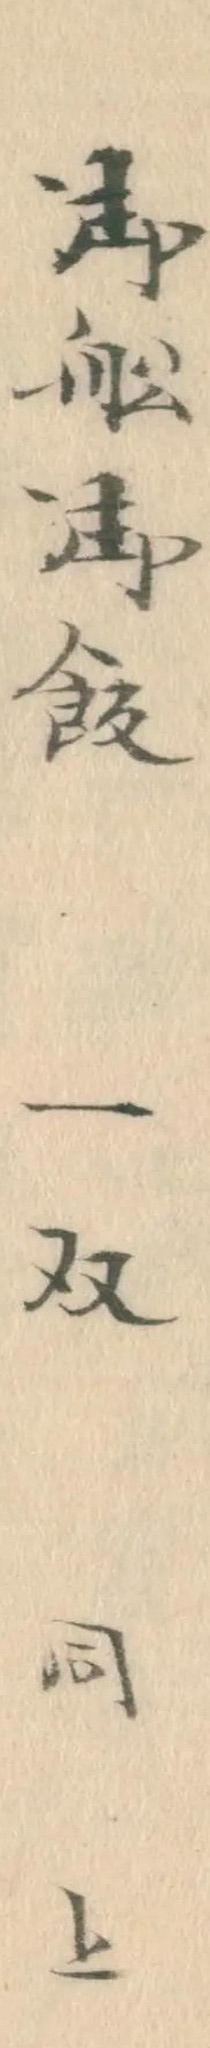一御船御飯一双同上
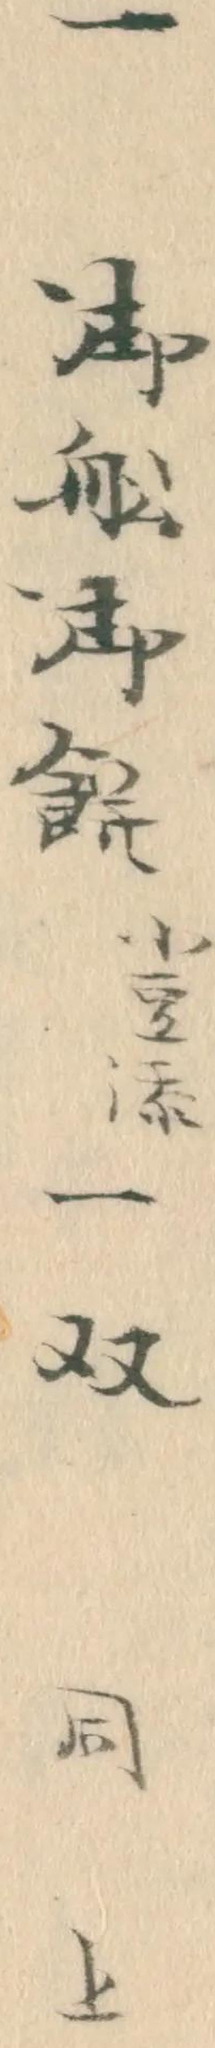一御船御餅小豆添一双同上
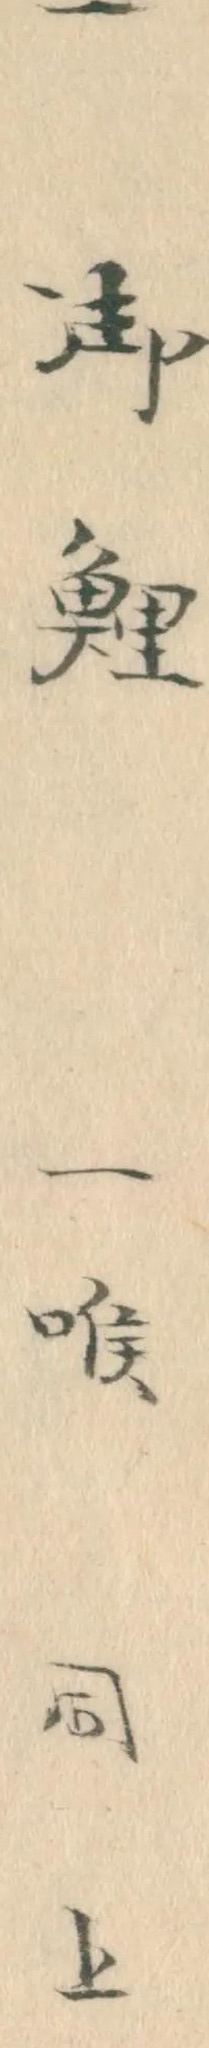一御鯉一喉同上

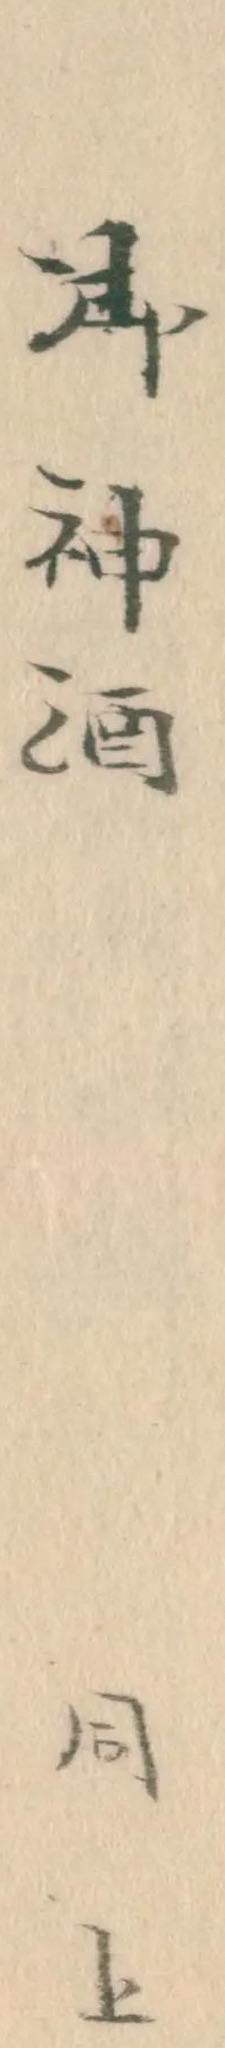一御神酒同上
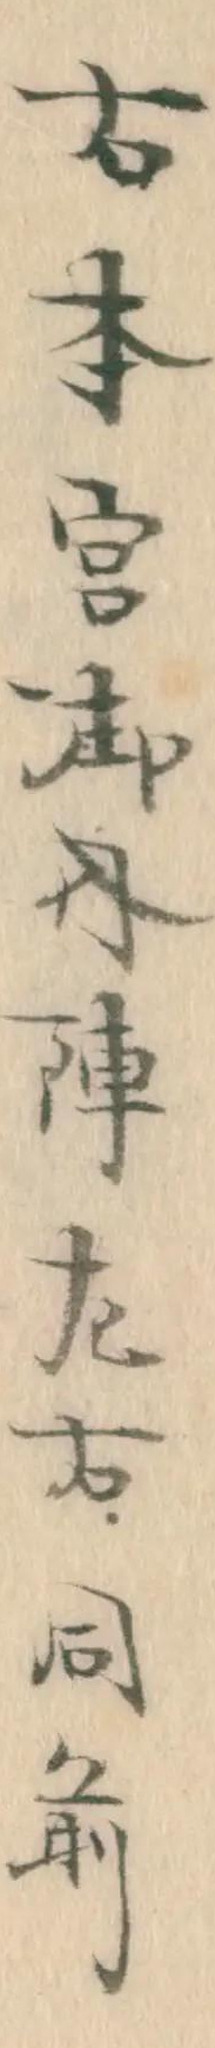右本宮御内陣左右同然

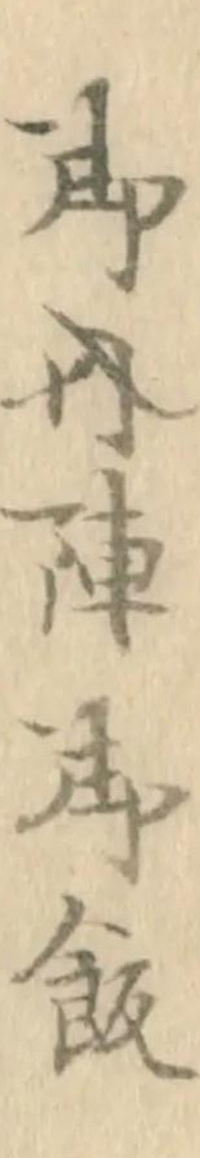御内陣御飯
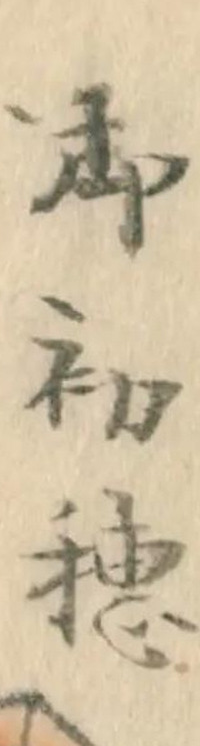御初穂
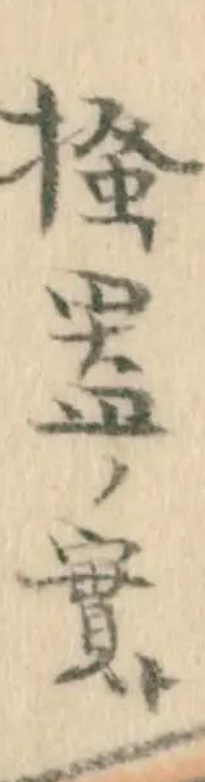掻器ノ実ト
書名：葵御祭供進之神饌諸品色目書
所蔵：国立国会図書館 National Diet Library, JAPAN
